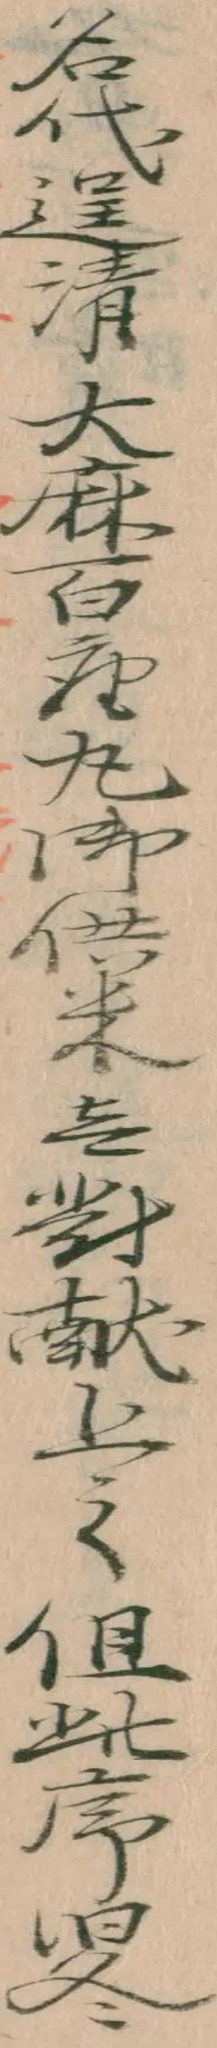名代逞清大麻百座丸御供米壱對献上之但此席旧冬
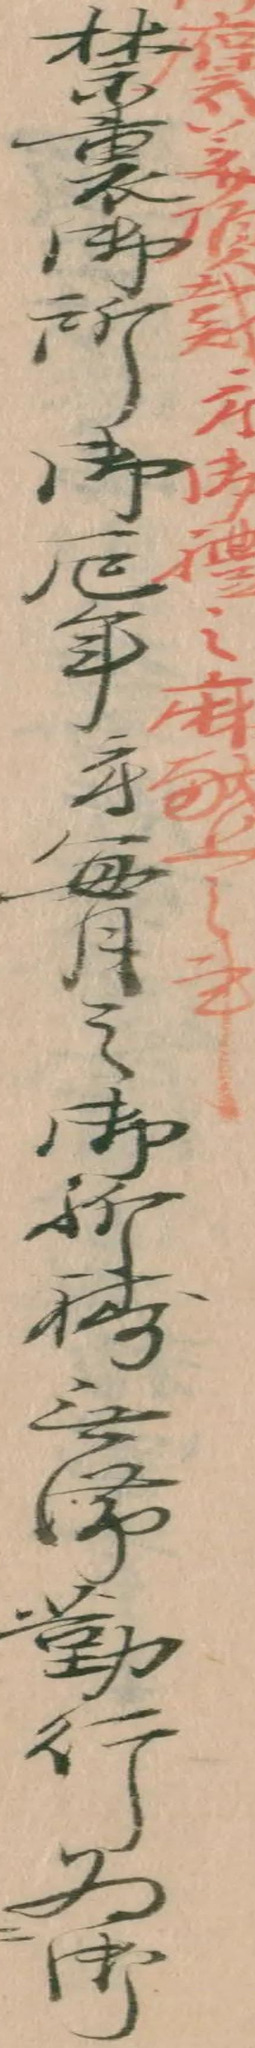禁裏御所御厄年ニ付毎月之御祈祷無滞勤行為御
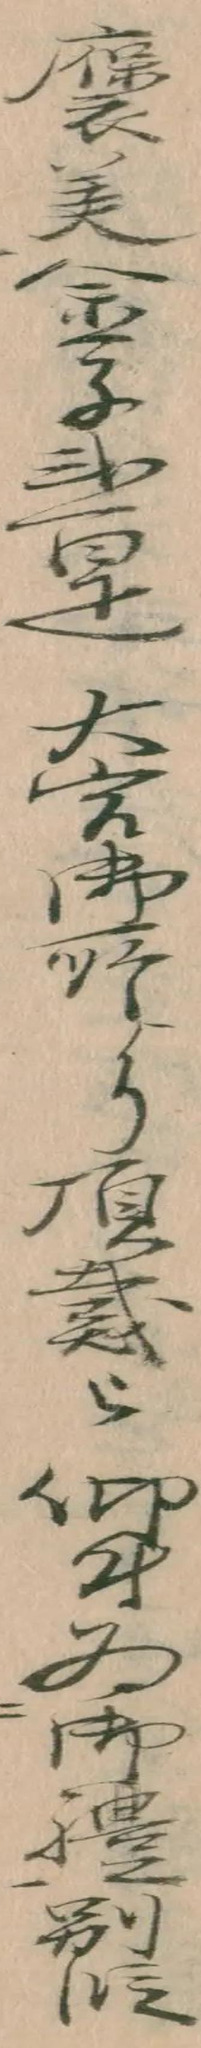褒美金子弐百疋大宮御所より頂戴被仰付為御禮別段
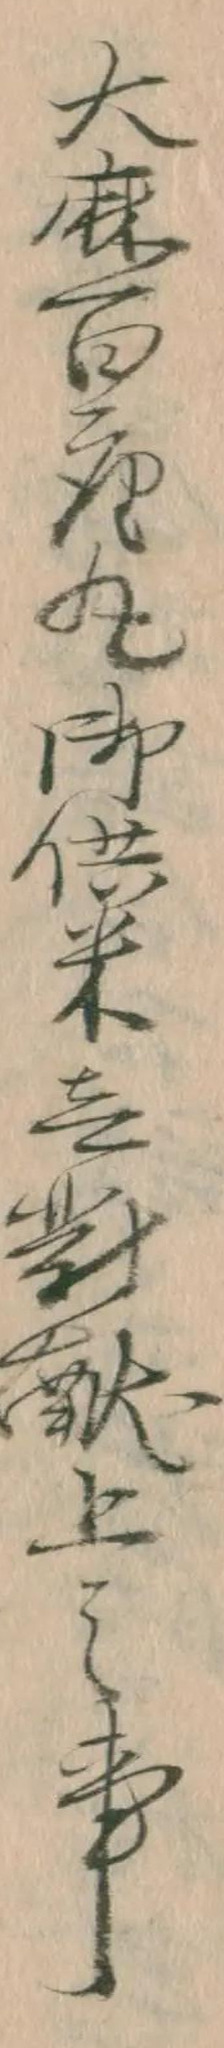大麻百座丸御供米壱對献上之事
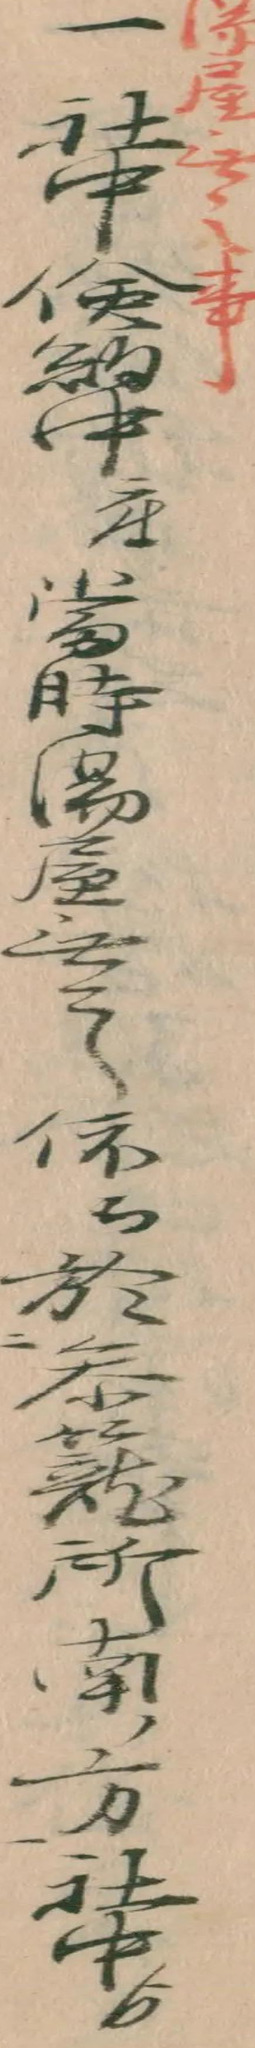一社中倹約中ニ付當時湯屋無之依而於参籠所南ノ方社中ゟ
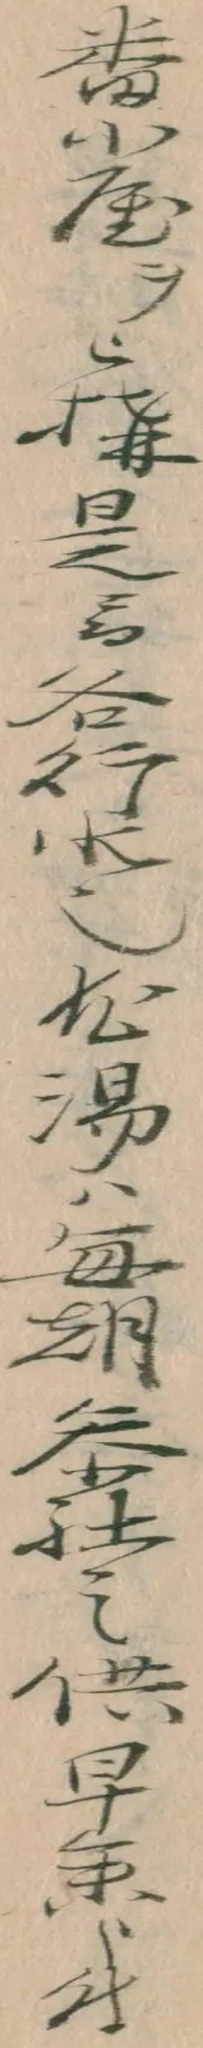番小屋ヲ被構是ニ而各行水也尤湯ハ毎朝参社之供早参申付
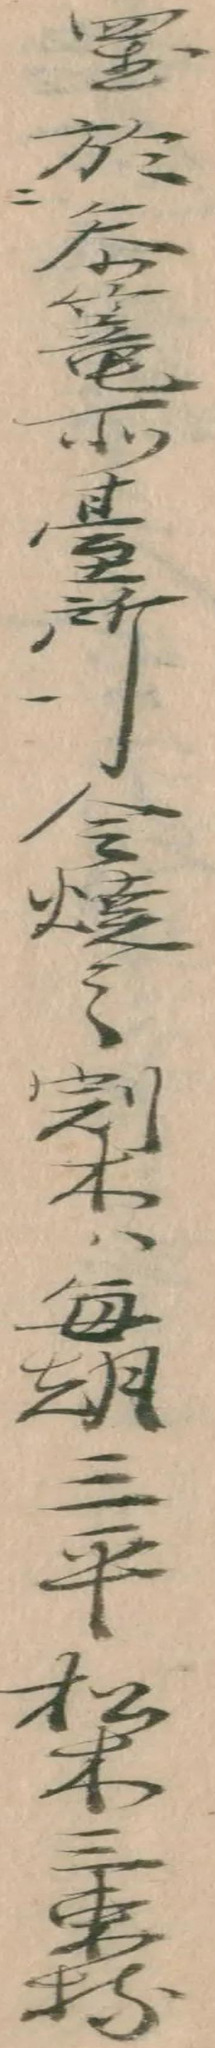置於参籠所䑓所令焼之割木ハ毎朝三平松木三束持
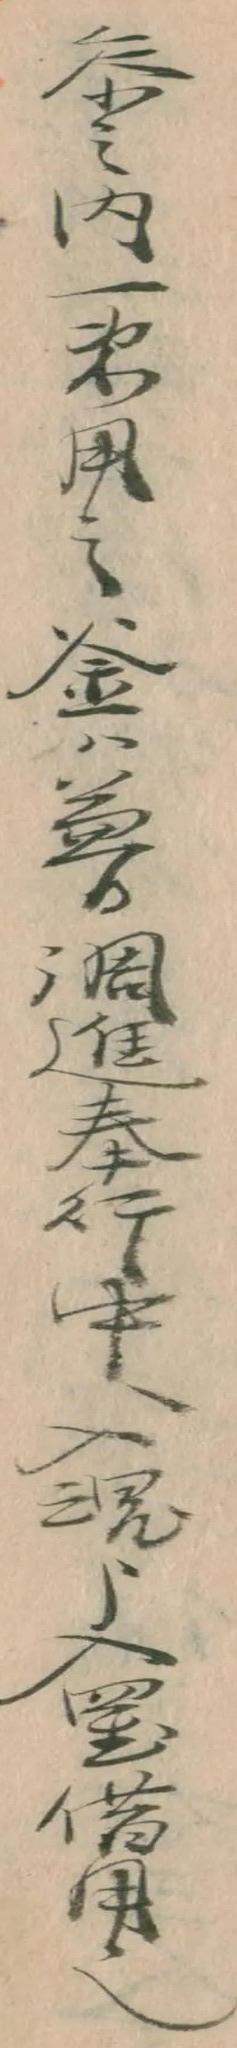参之内一束用之釜ハ兼日調進奉行中へ入魂申入置借用也
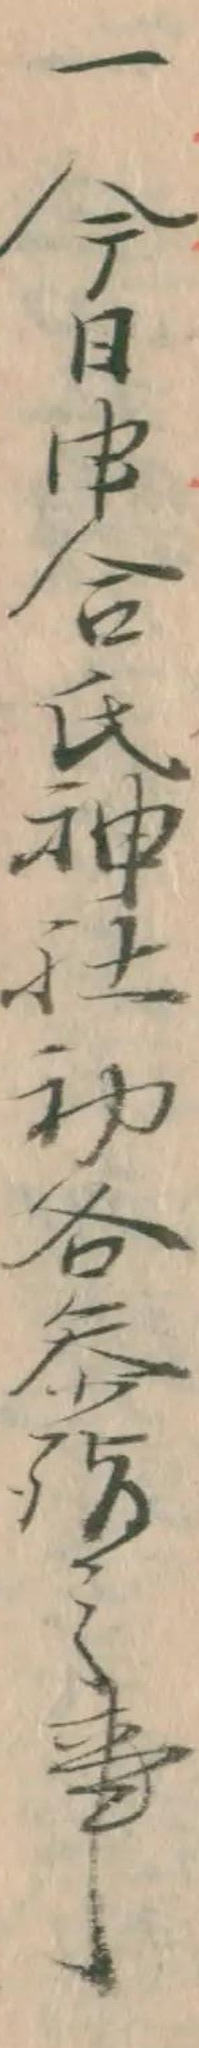一今日申合氏神社初各参詣之事

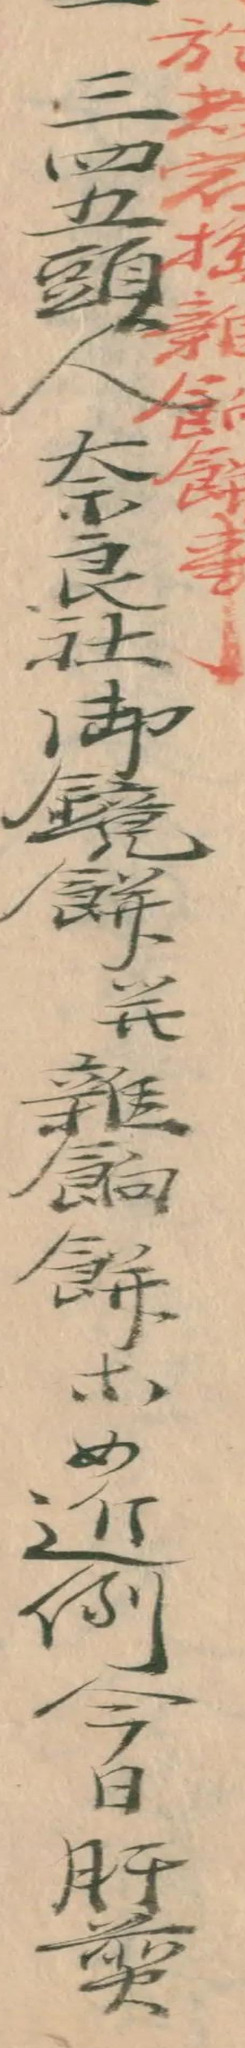一三四五頭人奈良社御鏡餅并雑餉餅等如近例今日肝煎
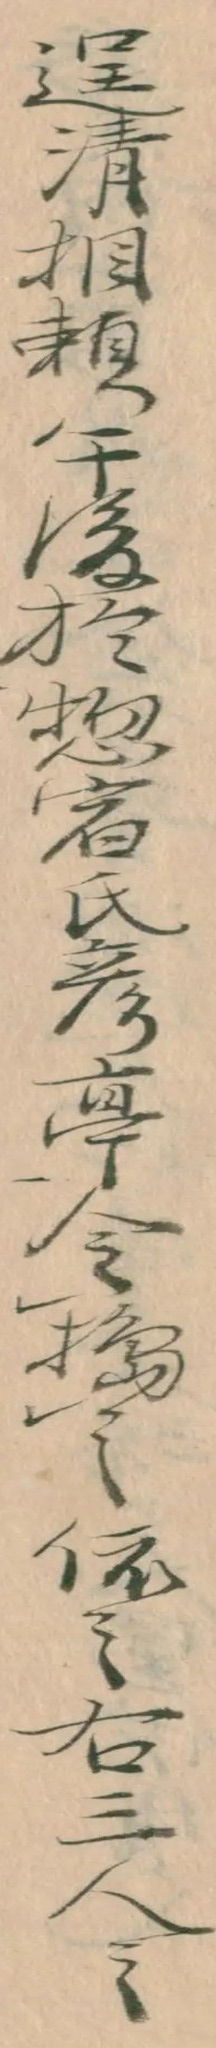逞清相頼午後於惣宿氏彦亭令搗之依之右三人之
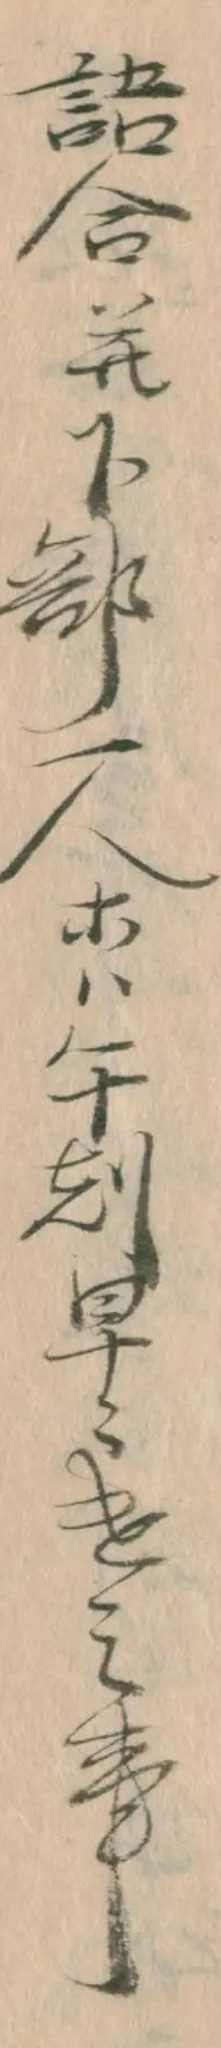語合幷下部一人等ハ午刻早々遣之事
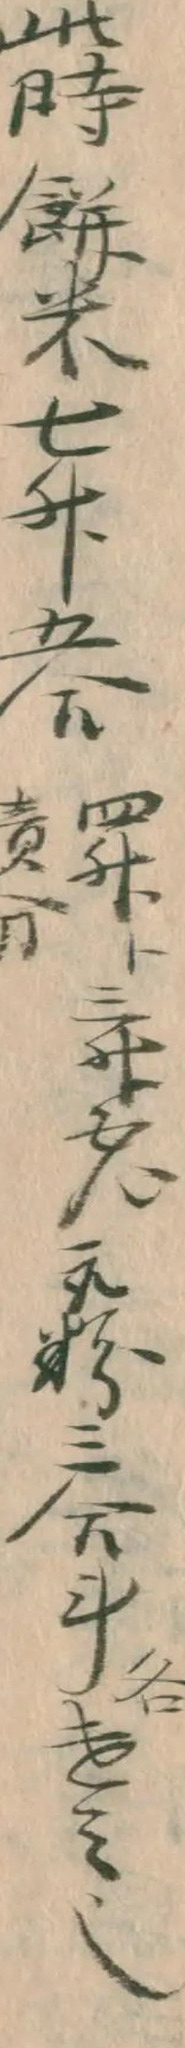但此時餅米七升五合四升ト三升五合漬分所粉三合斗各遣之也
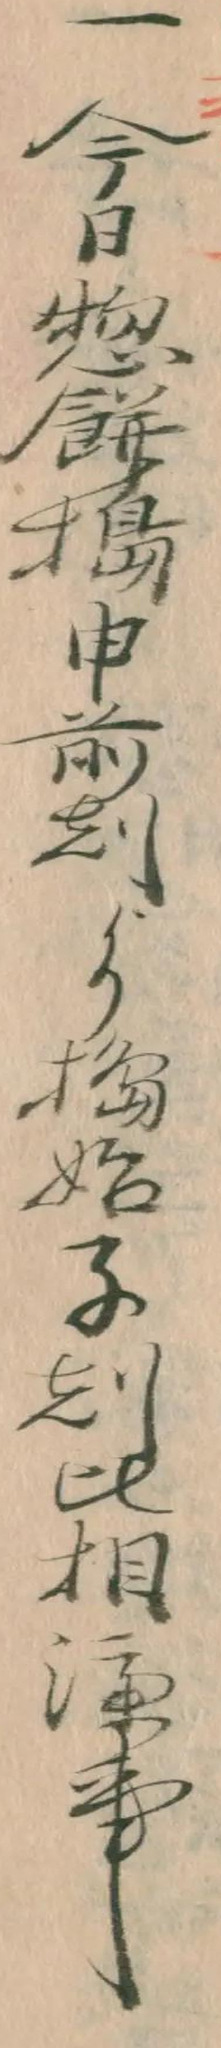一今日惣餅搗申前刻より搗始子刻比相済事
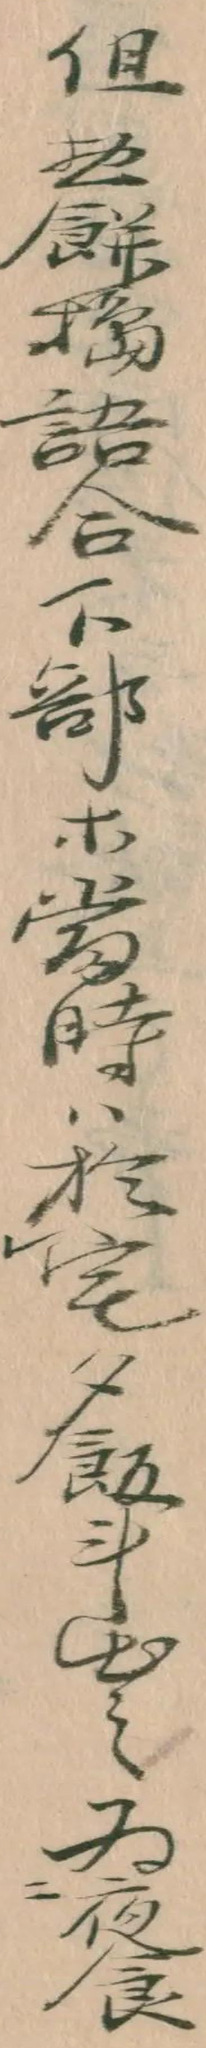但惣餅搗語合下部等當時ハ於宅夕飯斗出之為夜食
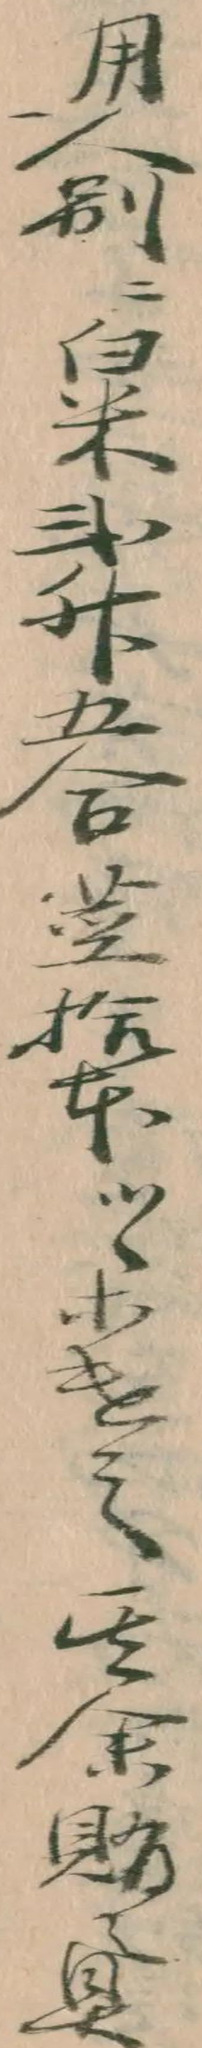用人別ニ白米弐升五合茎拾本ツヽ等遣之其余賄之具
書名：賀茂社記録. 第74冊
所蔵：国立国会図書館 National Diet Library, JAPAN
